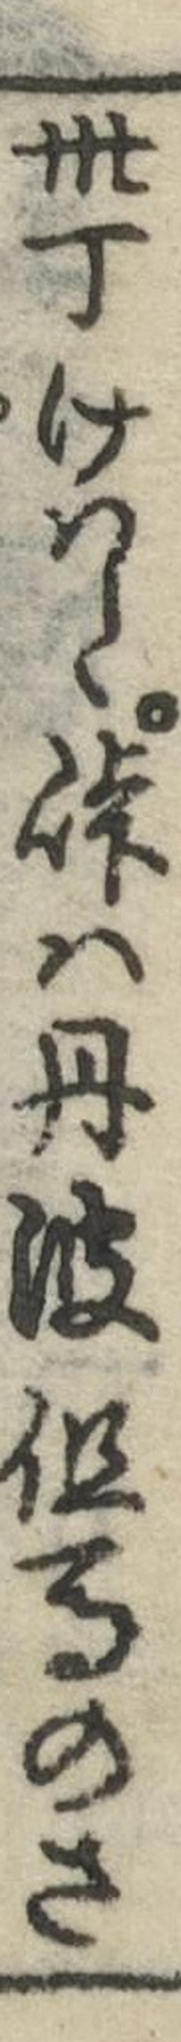丗丁けはし。峠は丹波但馬のさ
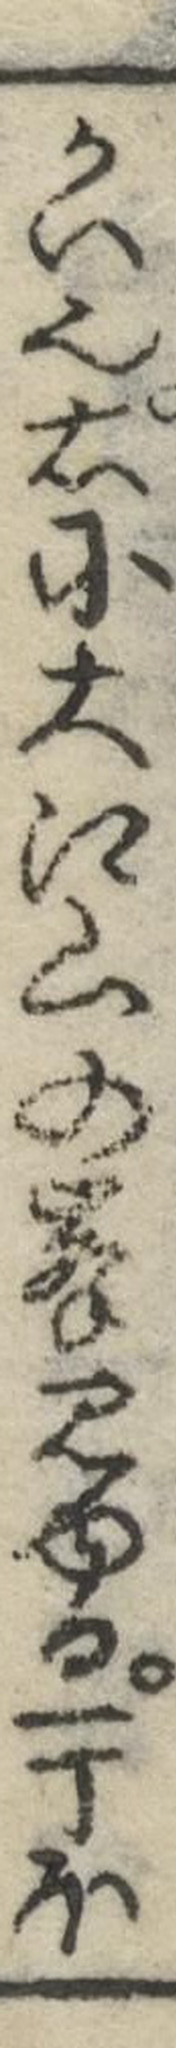かい也。右に大江山の峯見ゆる。一丁ほ
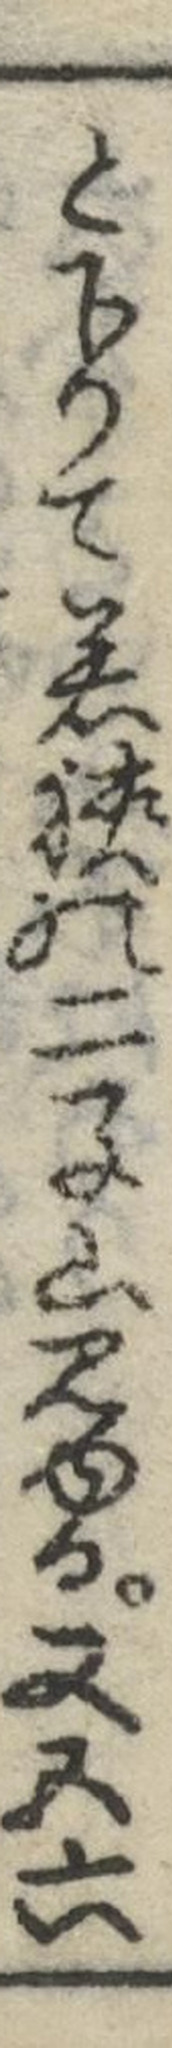と下りて若狭の二子山見ゆる。又五六
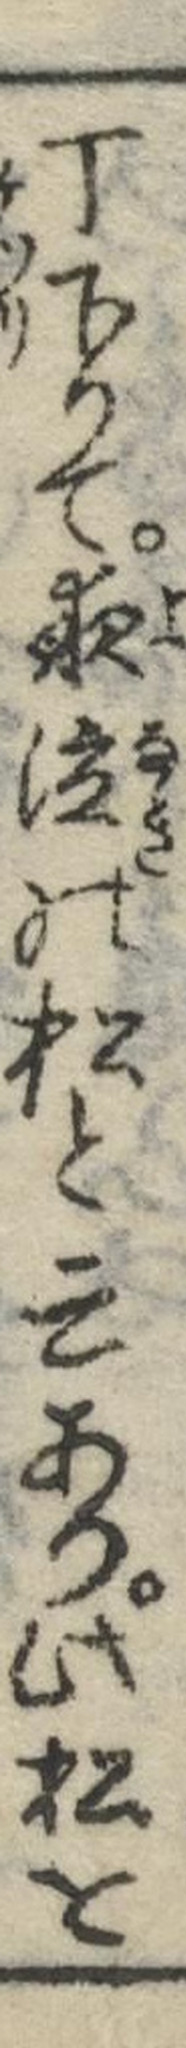丁下りて。夜泣の松と云あり。此松を
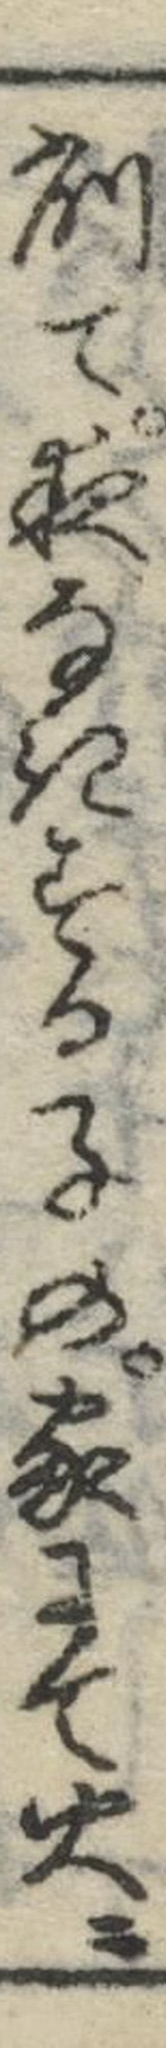削て。夜なきする子の。家にて火に
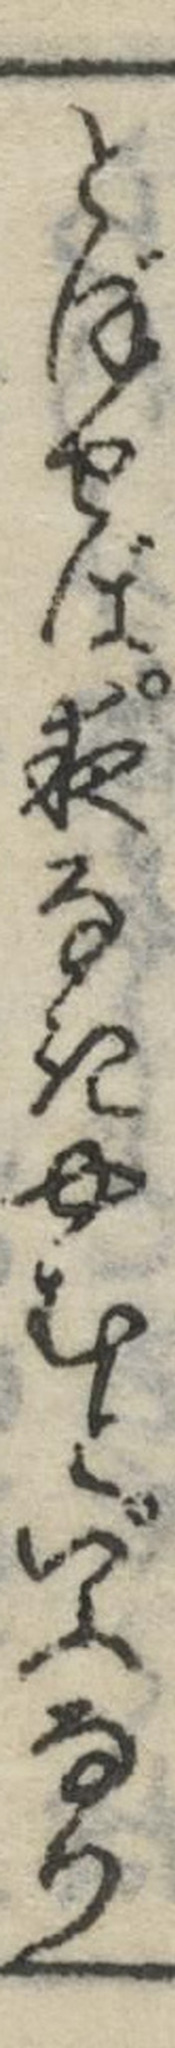とぼせば。夜なきやむと。いふなり
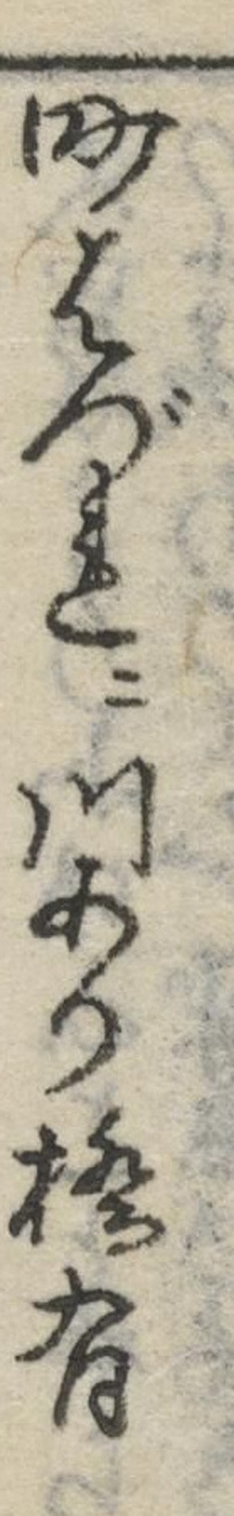町はづれに川あり橋有
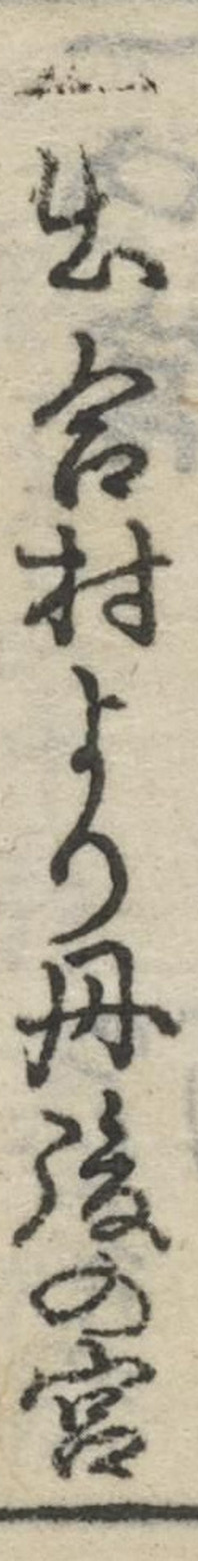一出合村より丹後の宮
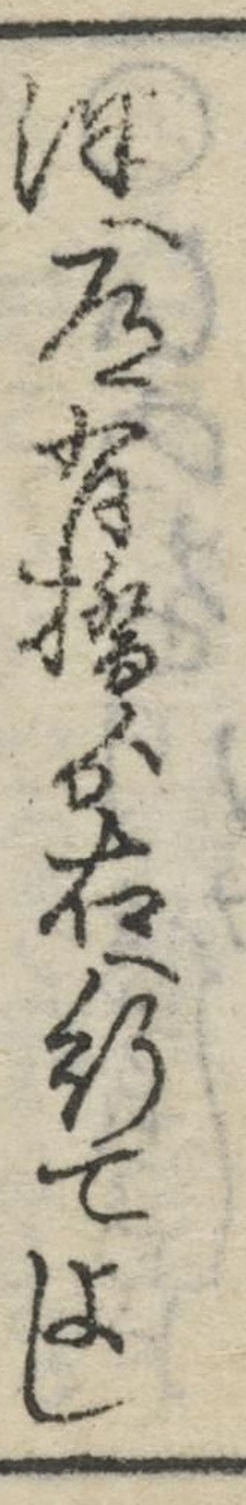津へ道有橋ゟ右へ行てよし
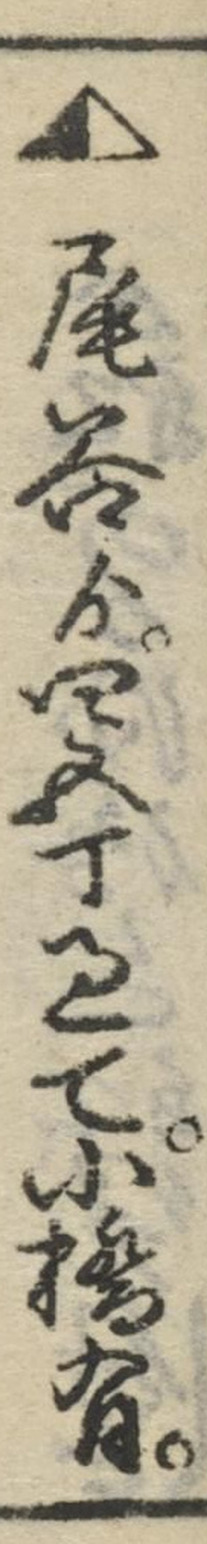▲尾谷ゟ。四五丁過て。小橋有。
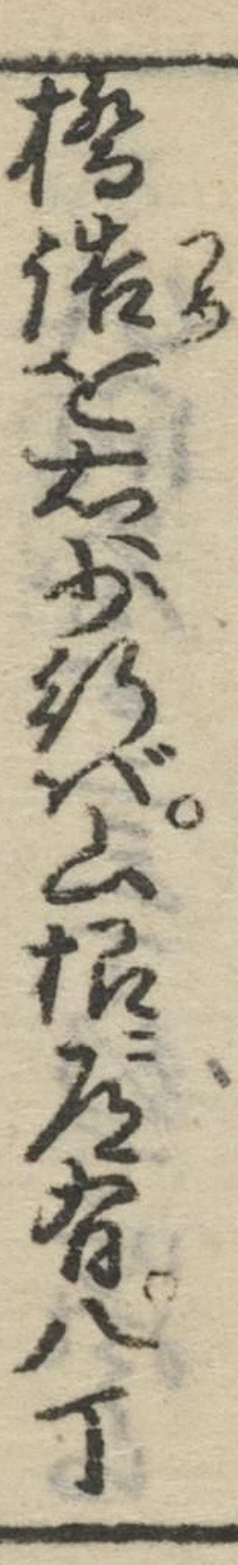橋詰を右へ少行ば。山根に道有。八丁
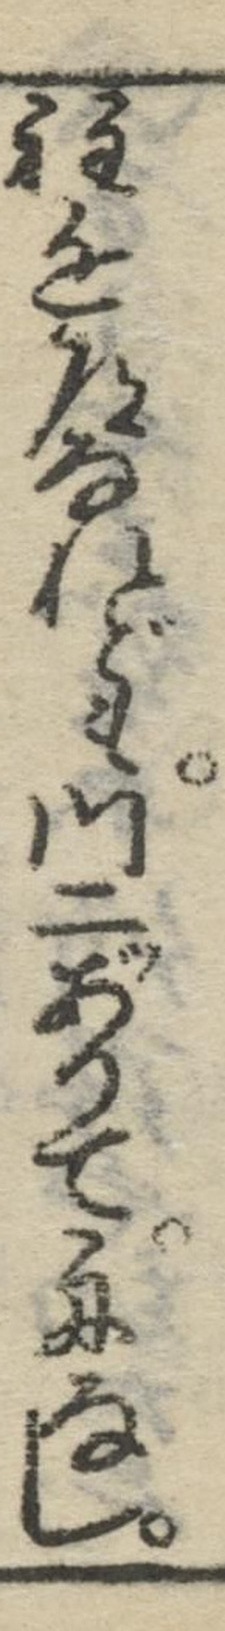程近道なれども。川二つありて。舟なし。
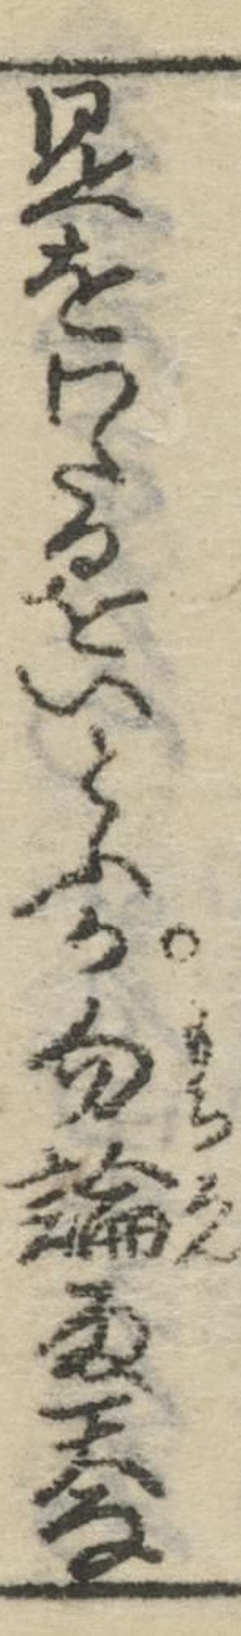是をわたるをいとふか。勿論雨天な
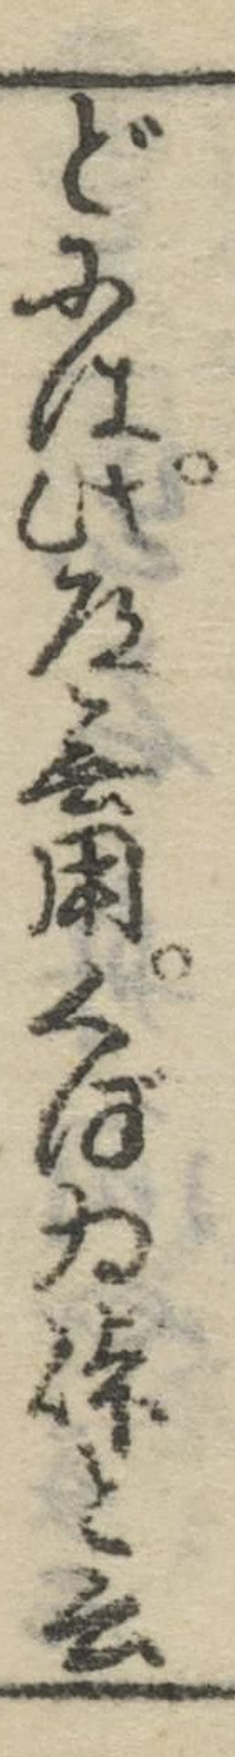どには。此道無用。くほゐ峠と云
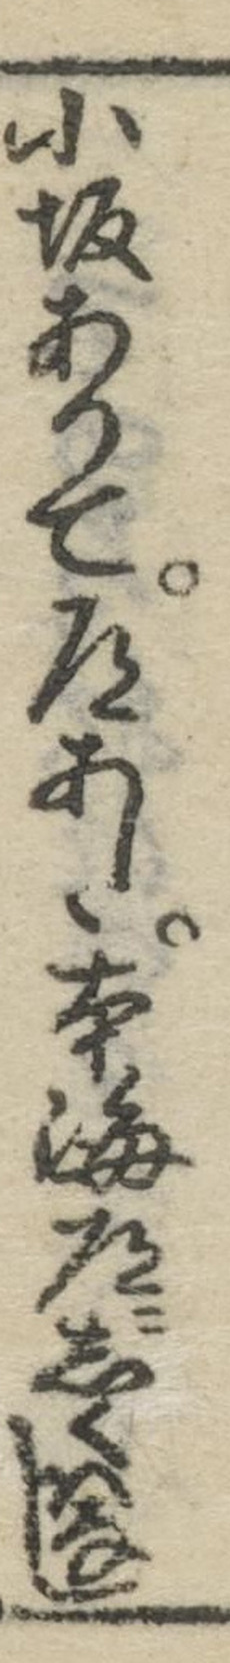小坂ありて。道あり。本海道にしくはなし

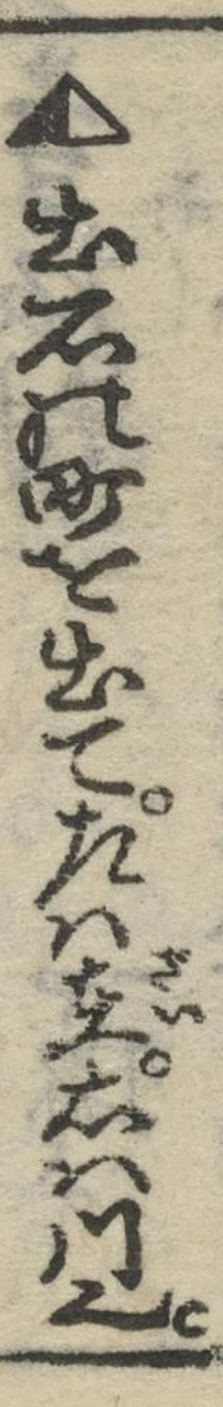▲出石の町を出て。左は在。右は川也。
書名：但州城崎浴湯辧
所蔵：東京大学地震研究所図書室 Earthquake Research Institute Library, The University of Tokyo, JAPAN
